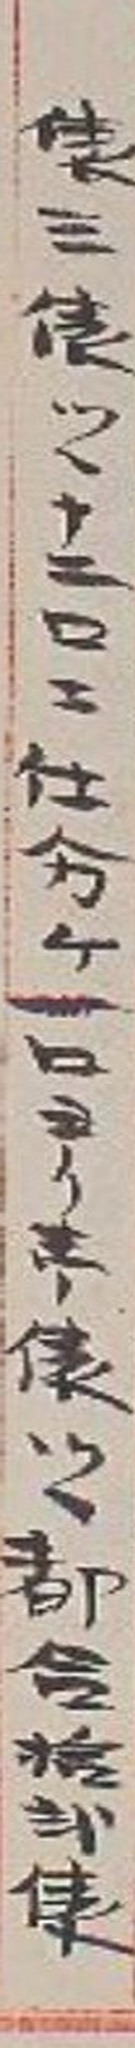俵三俵ツヽ十二口ニ仕分ケ一口ヨリ壱俵ツヽ都合拾弐俵
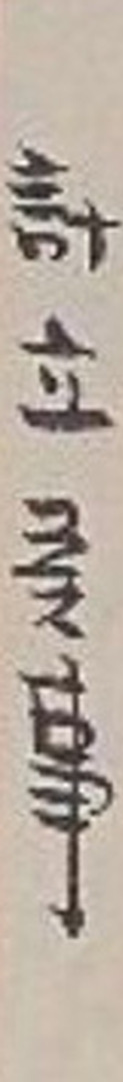計立候事
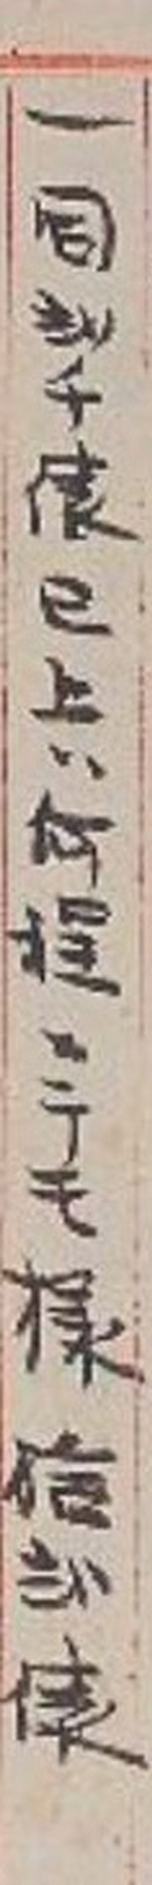一同弐千俵已上ハ何程ニテモ様拾弐俵
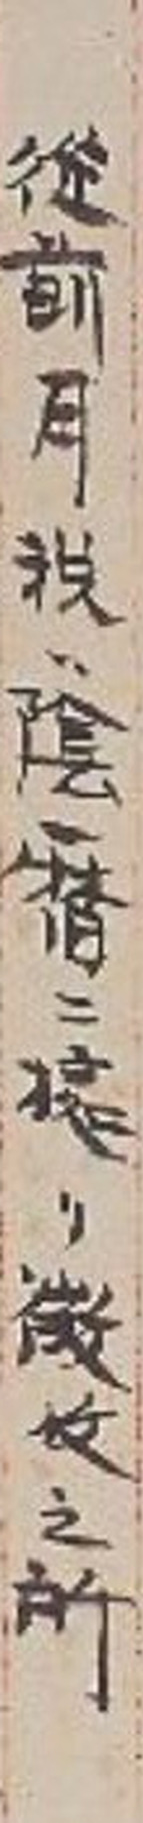従前月税ハ陰暦ニ拠リ徴収之所
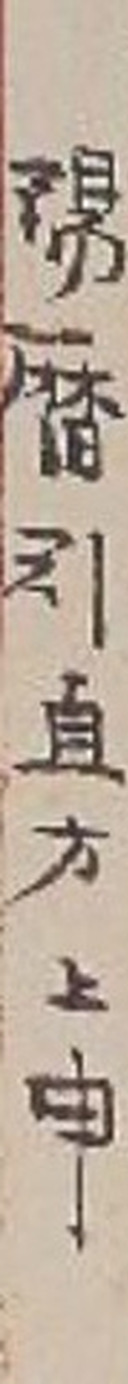陽暦引直方上申
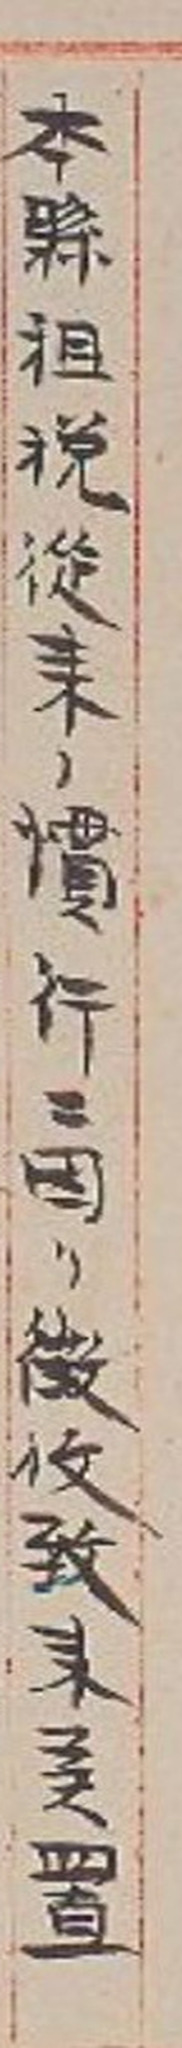本県租税従来ノ慣行ニ因リ徴収致来候置
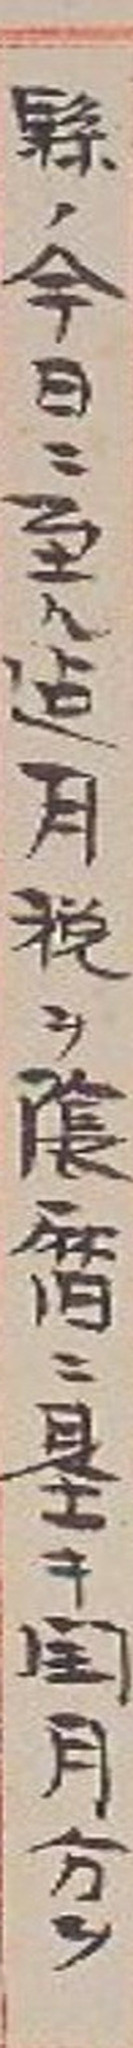県ノ今日ニ至ル迄月税ヲ陰暦ニ基キ閏月分ヲ
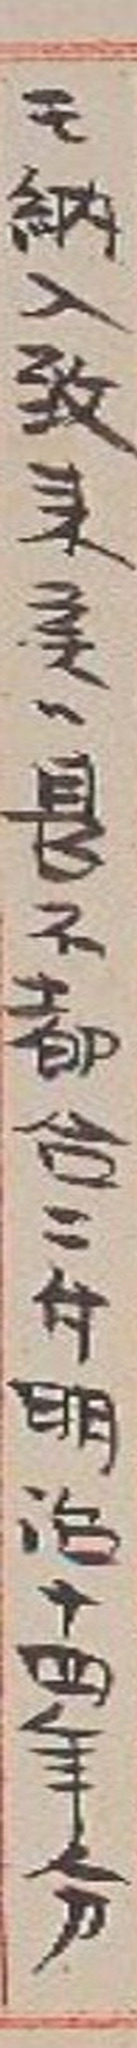モ納入致来候ハ甚不都合ニ付明治十四年分
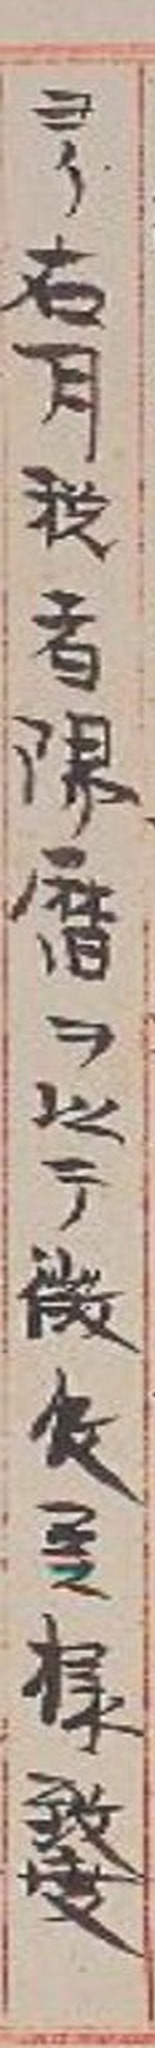ヨリ右月税者陽暦ヲ以テ徴収候様致度
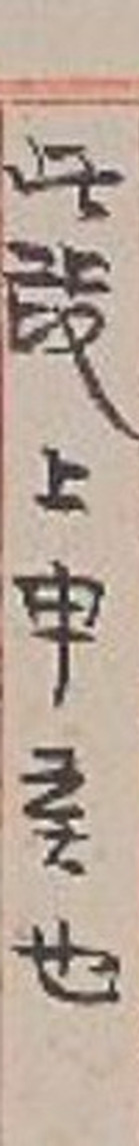此段上申候也

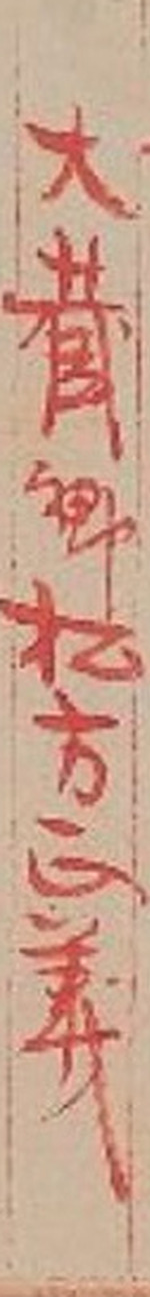大蔵卿松方正義
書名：貢納物品領収旧藩慣例並ニ置県後取扱順序
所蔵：University of the Ryukyus Library
